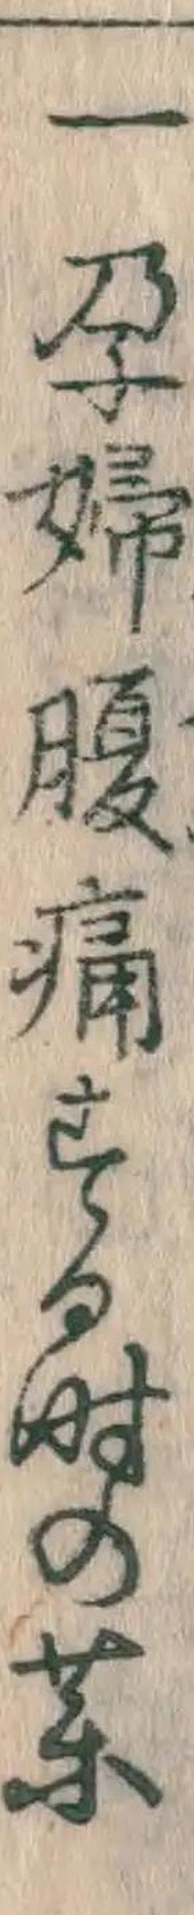一孕婦腹痛する時の薬
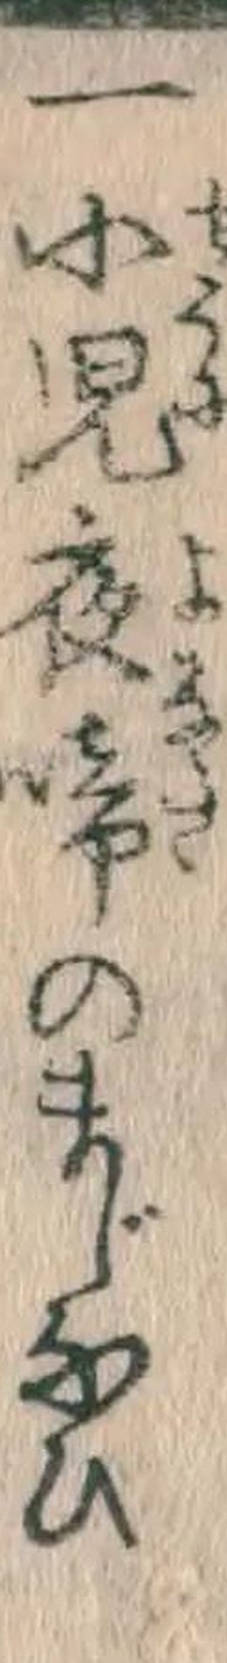一小児夜啼のまじなひ
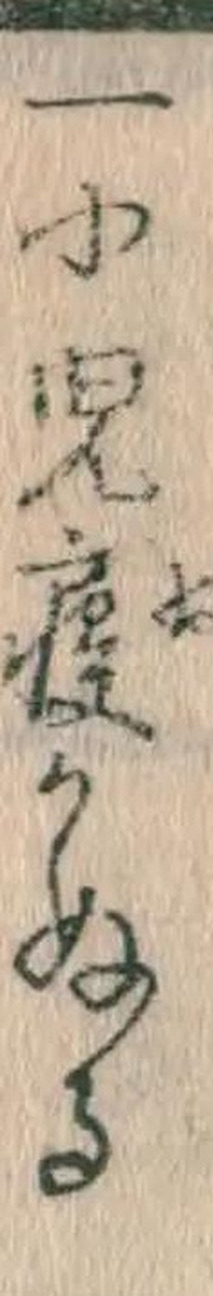一小児寝らぬ事
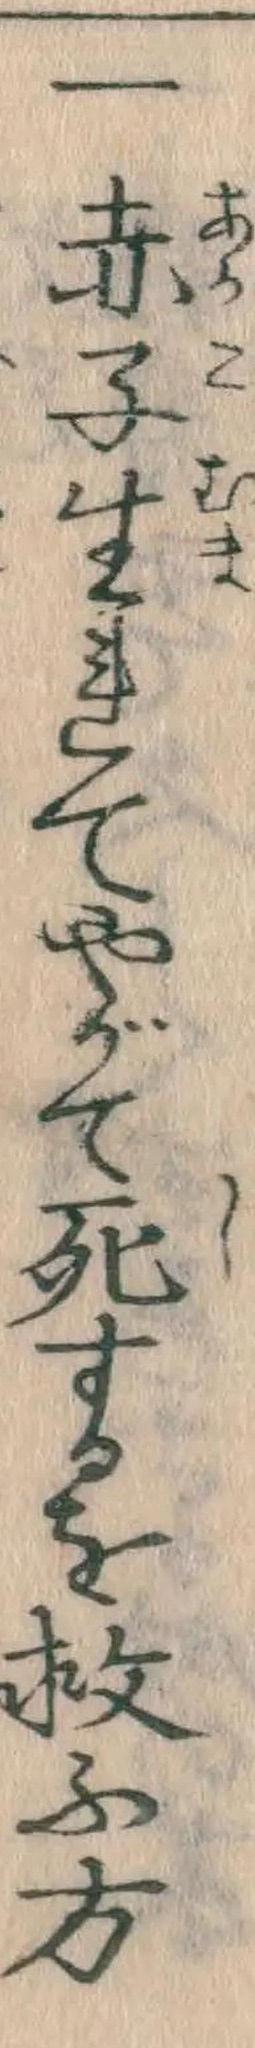一赤子生れてやがて死するを救ふ方
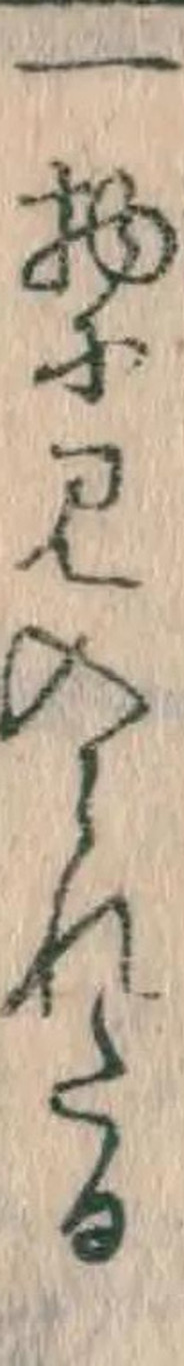一物に見入られたる
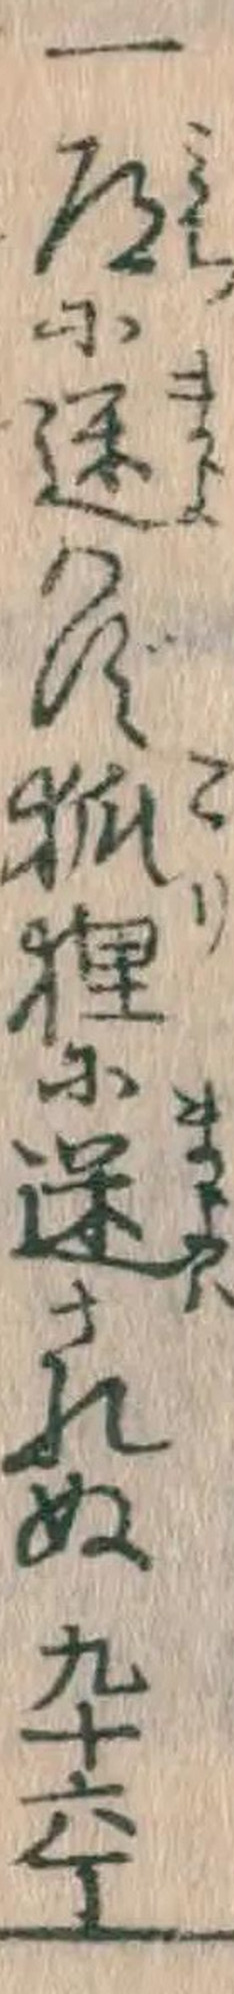一道に迷はず狐狸に迷されぬ九十六丁
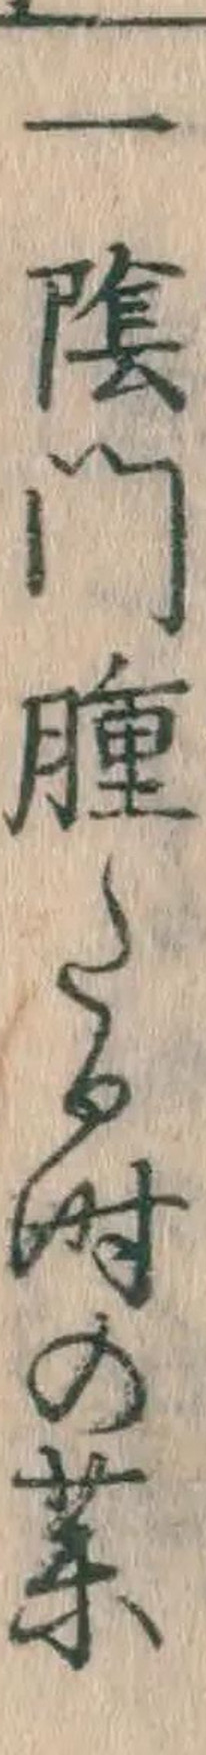一陰門腫たる時の薬
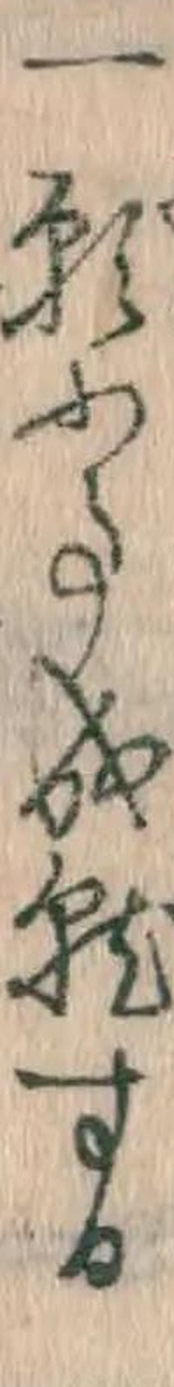一願ふ事成就する
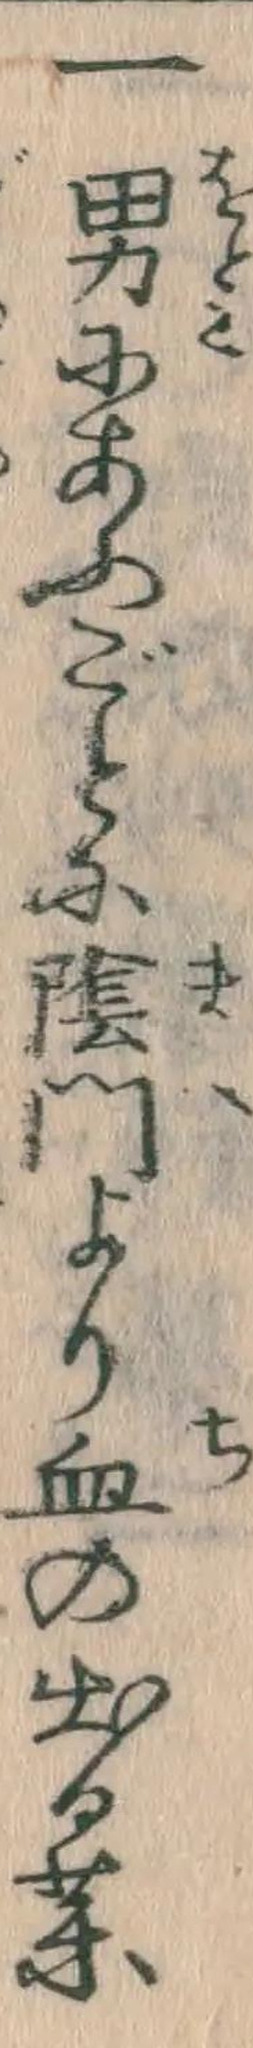一男にあふごとに陰門より血の出る薬
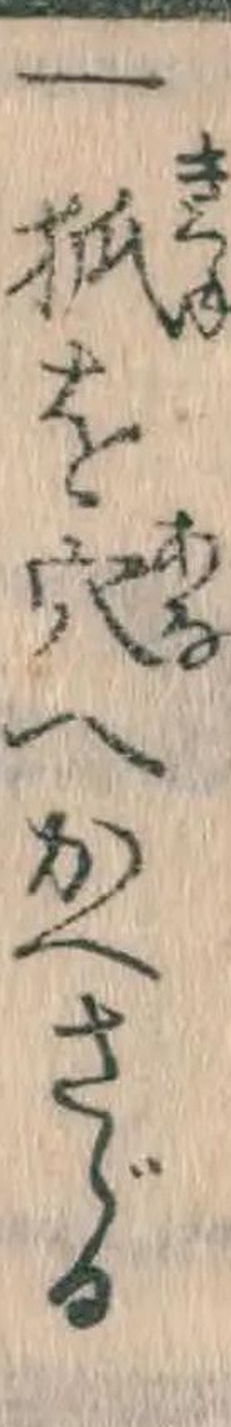一狐を穴へかへさゞる
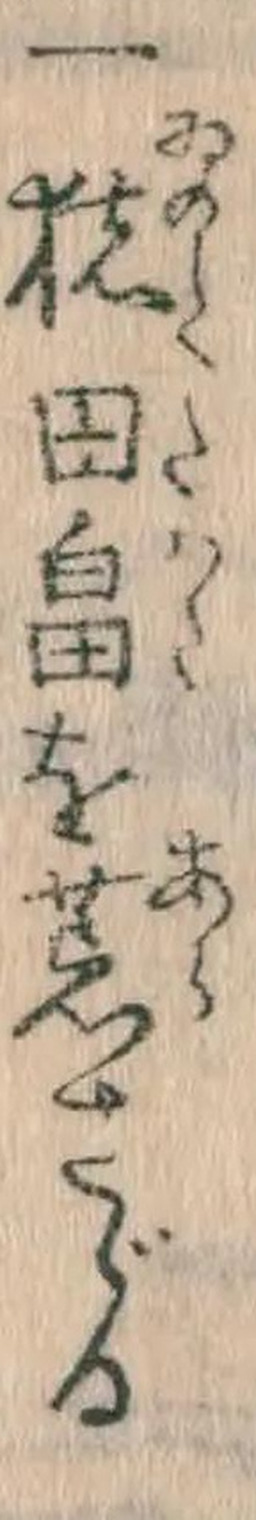一猪田畠を荒さゞる
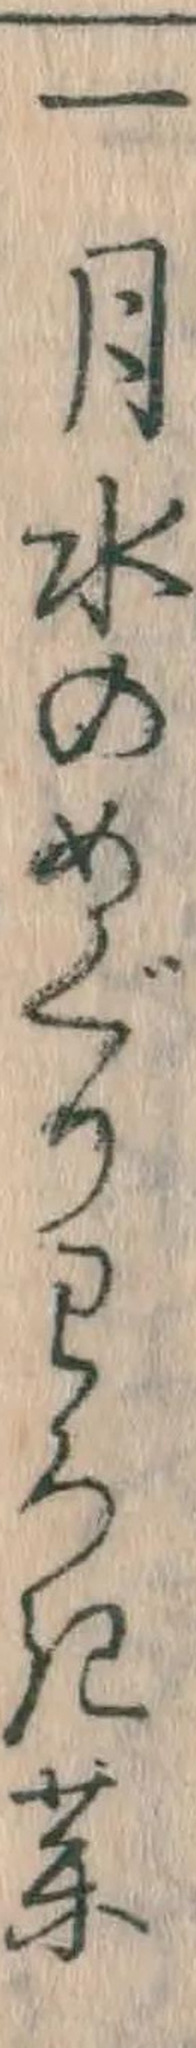一月水のめぐりわろき薬
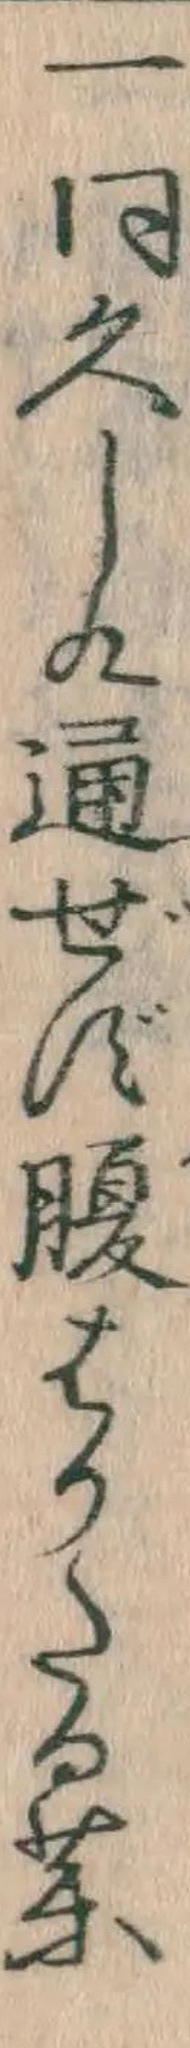一同久しく通ぜず腹はりたる薬
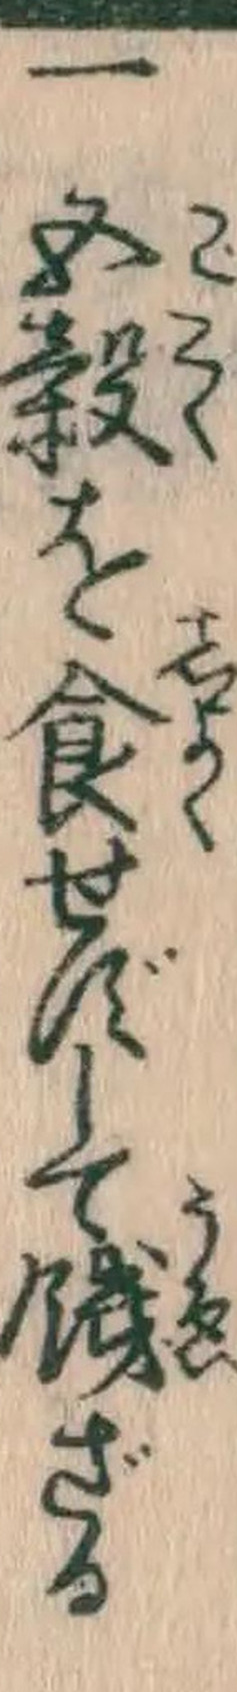一五穀を食せずして饑ざる
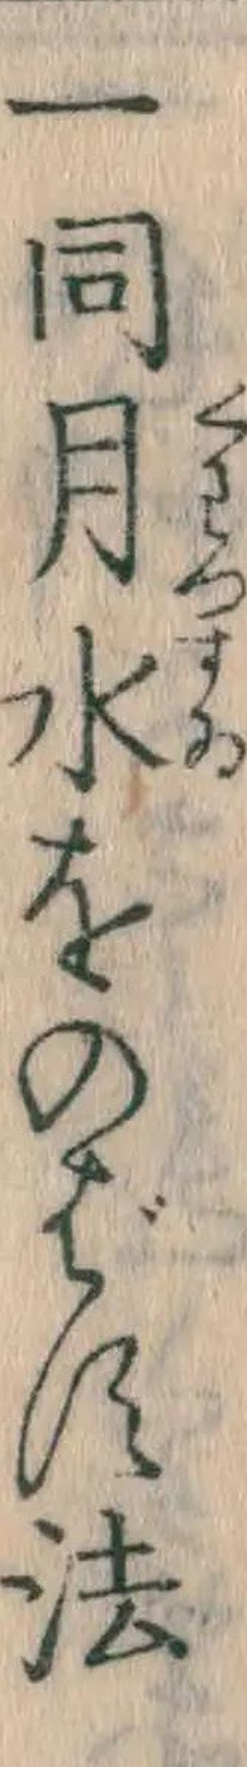一同月水をのばす法
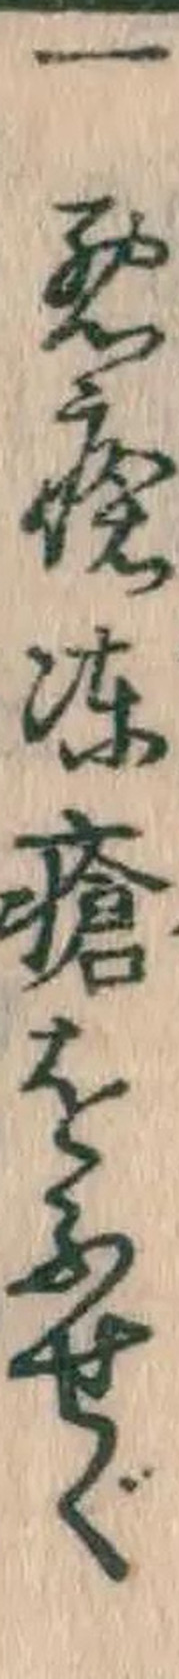一悪瘡凍瘡をふせぐ
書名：広益秘事大全 3巻. [1]
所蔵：国立国会図書館 National Diet Library, JAPAN
